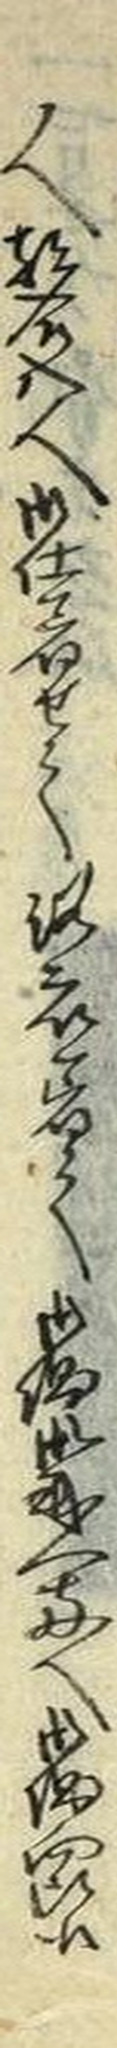人都合八人御仕着せ之浴衣着之御側御用人両人御側向頭取
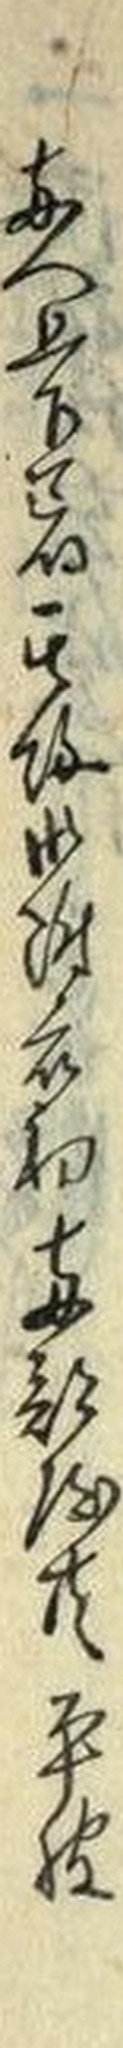両人上下着其後御附衆初両部屋共平服

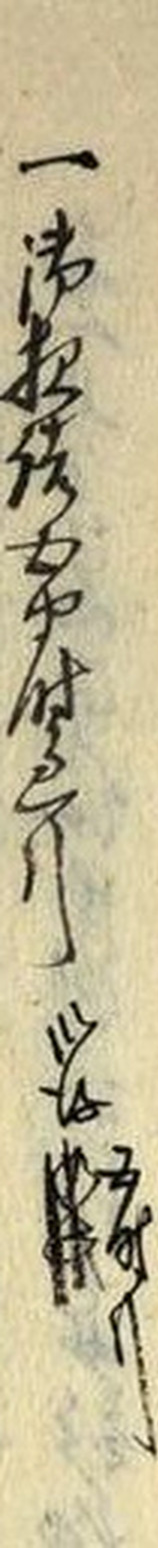一御夜詰五半時過引以後五時引
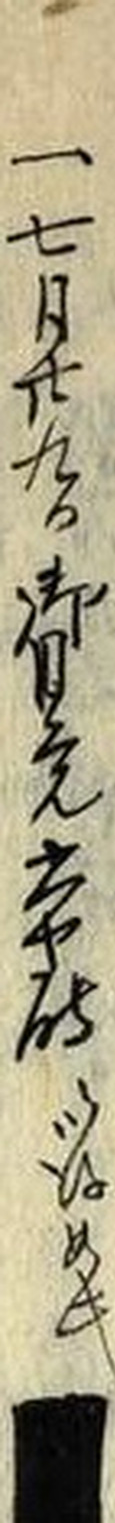一七月廿九日御目覚六半時以後如此
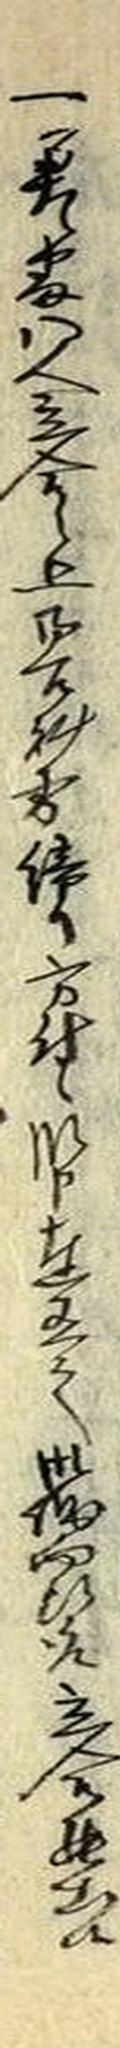一奥番八人立合之上御召料方締り方付候段申達有之御側向頭取立合罷出候
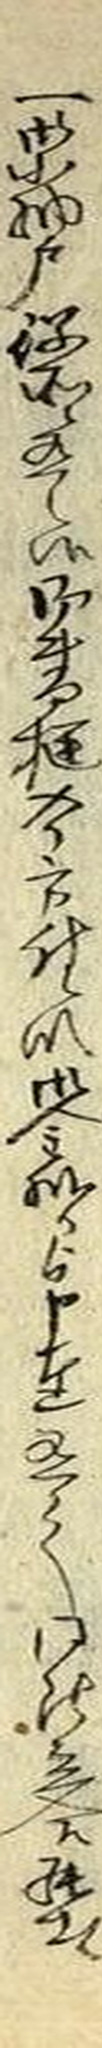一御小納戸役所ニ有之候御書櫃入り方付候段御金掛りゟ申達有之同断立合罷出候
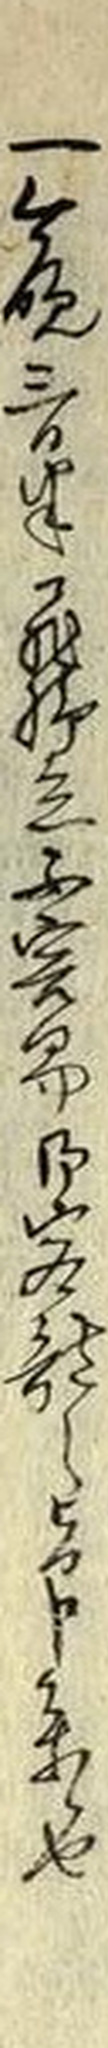一今晩三日半飛脚立不容易御容軆之旨申参候由
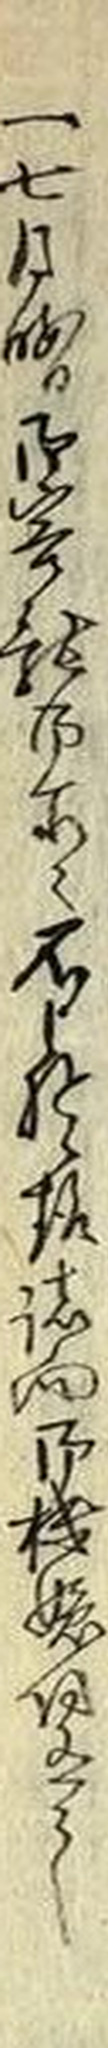一七月晦日御容軆御品々不被遊候趣諸向御機嫌伺有之
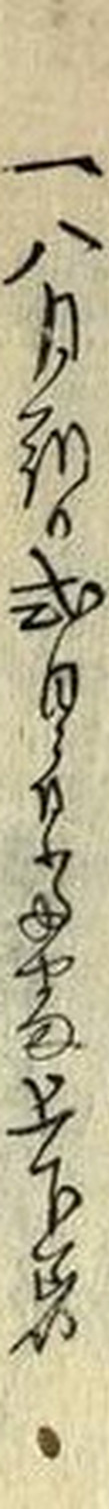一八月朔日式日ニ付当番上下着
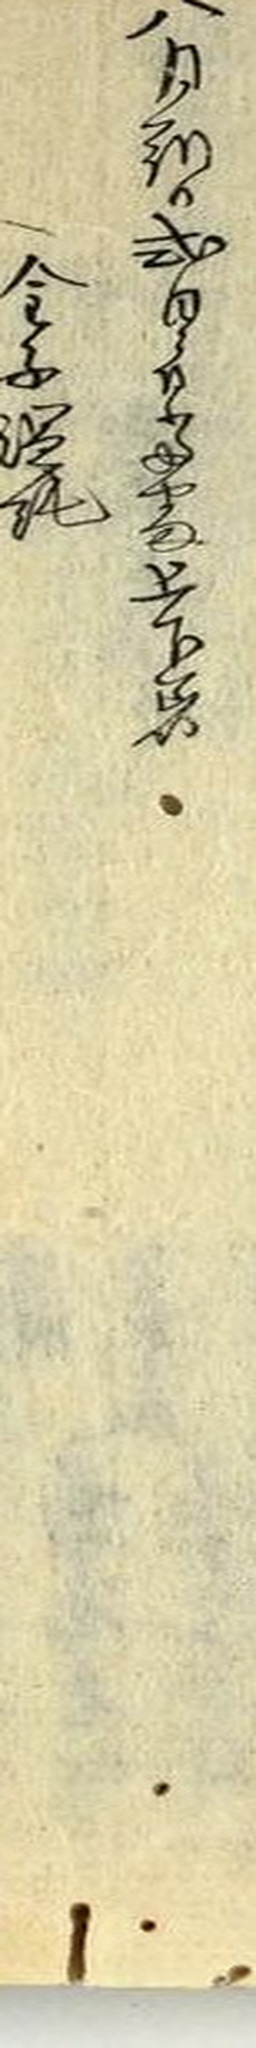金子饂飩
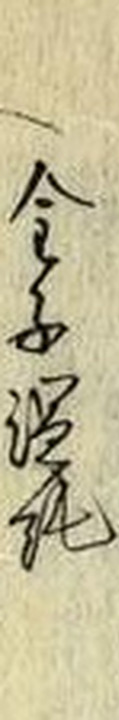金子饂飩
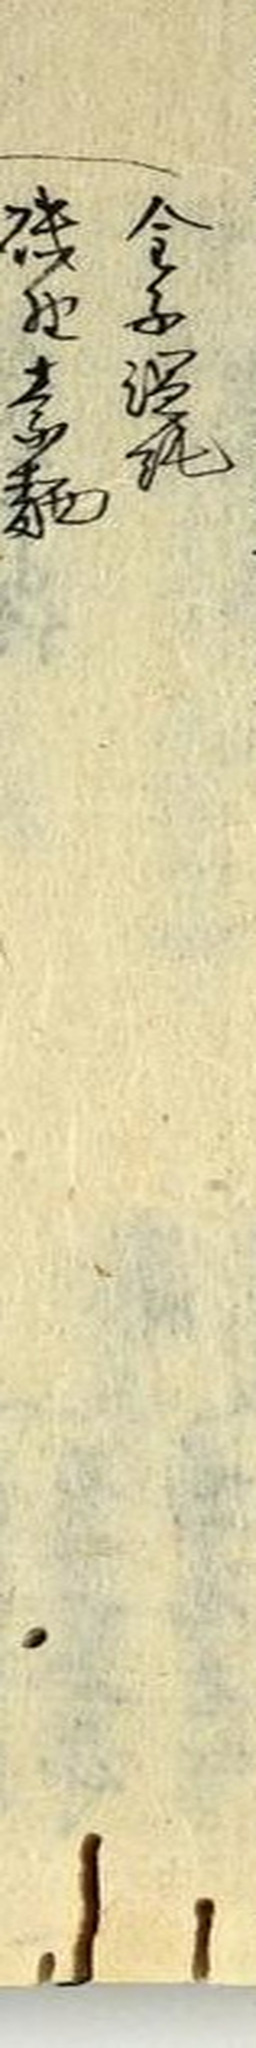磯野素麺
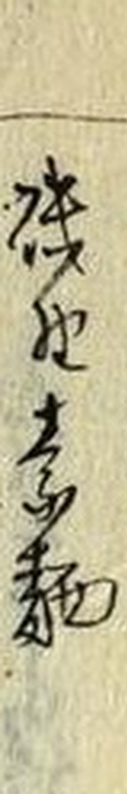磯野素麺
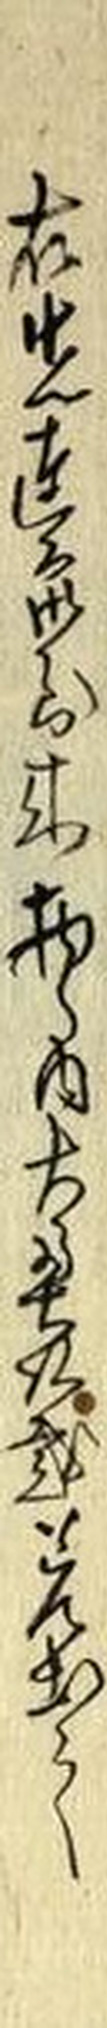右先達而御到来物之内大奥頂戴差出之
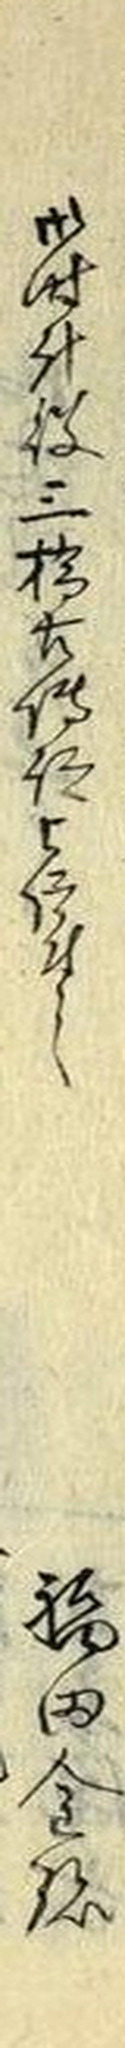御時計役三橋左伝跡被仰付之福田金弥
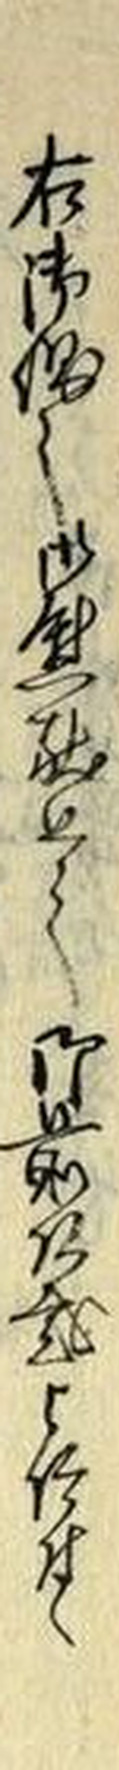右御側之御慰献上之御前頂戴被仰付候
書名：少傅日録抄（斉善付側向頭取日記、江戸并道中、初入在国、逝去後…
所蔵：福井県文書館 Fukui Prefectural Archives
